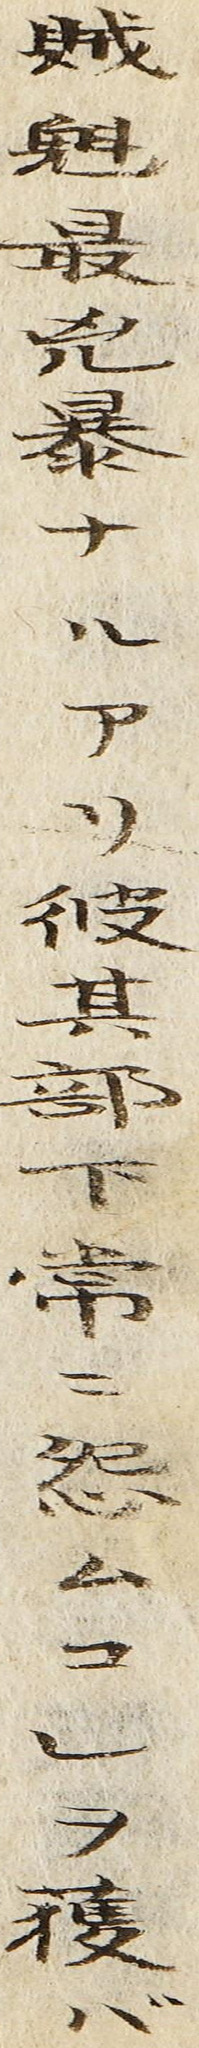賊魁最兇暴ナルアリ彼其部下常ニ怨ムコレヲ獲バ
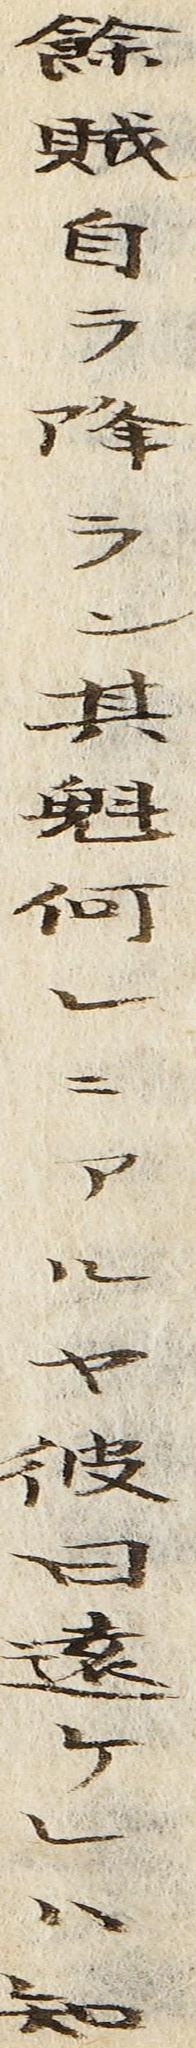余賊自ラ降ラン其魁何レニアルヤ彼曰遠ケレハ知
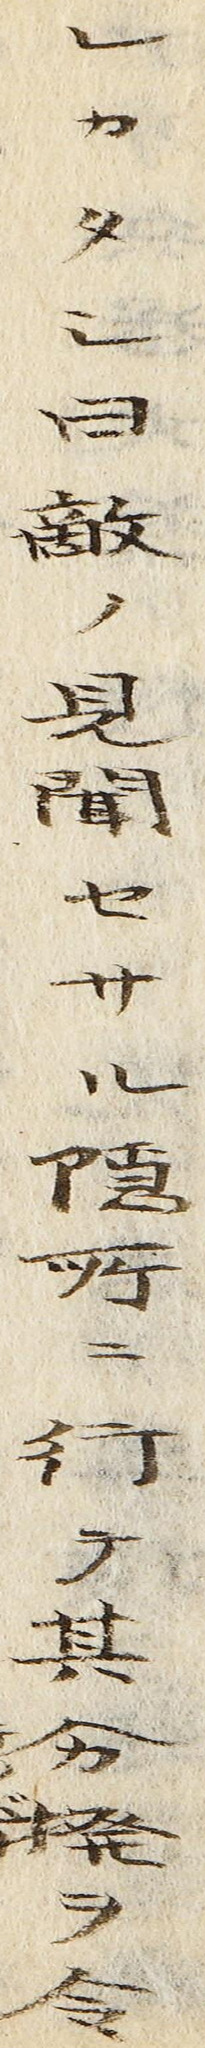レカタシ曰敵ノ見聞セサル隠所ニ行テ其分撥ヲ令
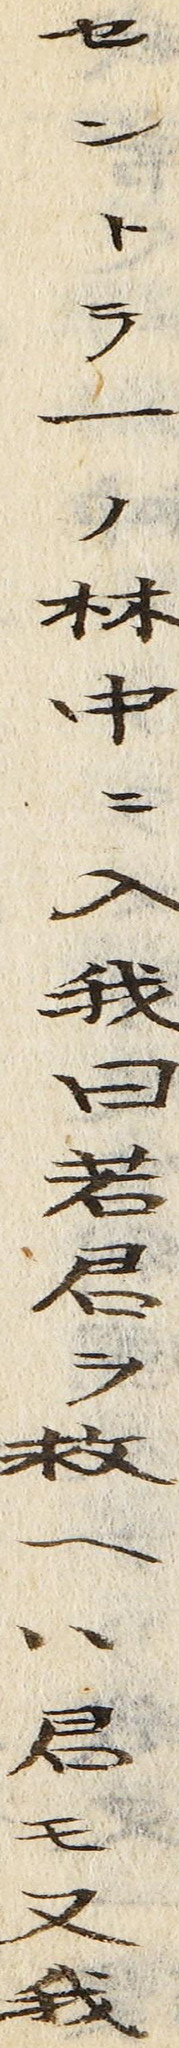セントテ一ノ林中ニ入我曰若君ヲ救ヘハ君モ又我
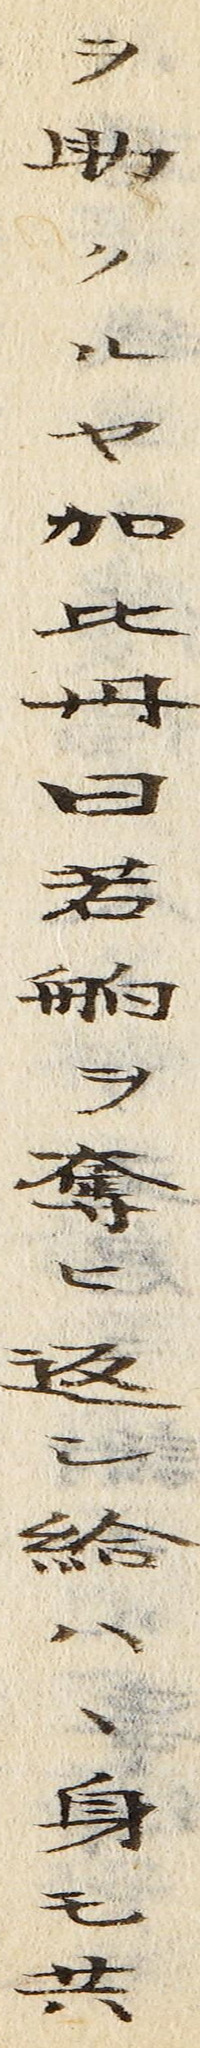ヲ助クルヤ加比丹曰若舶ヲ奪ヒ返シ給ハヽ身モ共
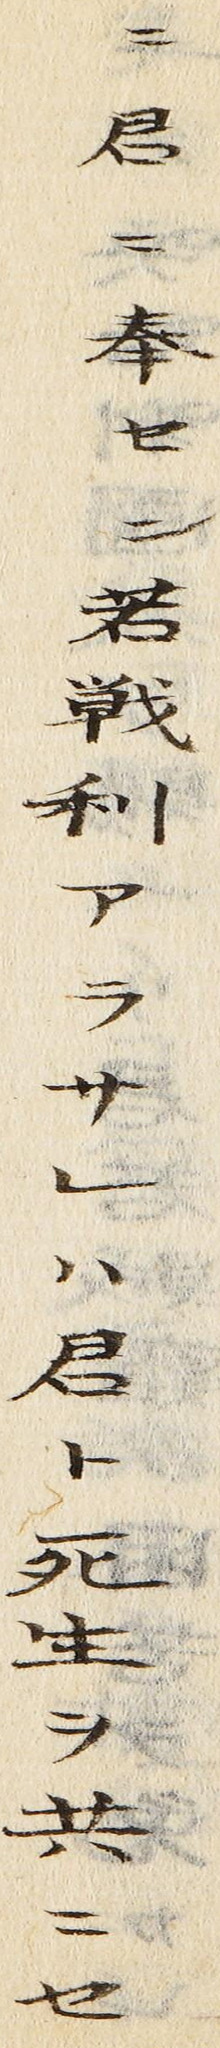ニ君ニ奉セン若戦利アラサレハ君ト死生ヲ共ニセ
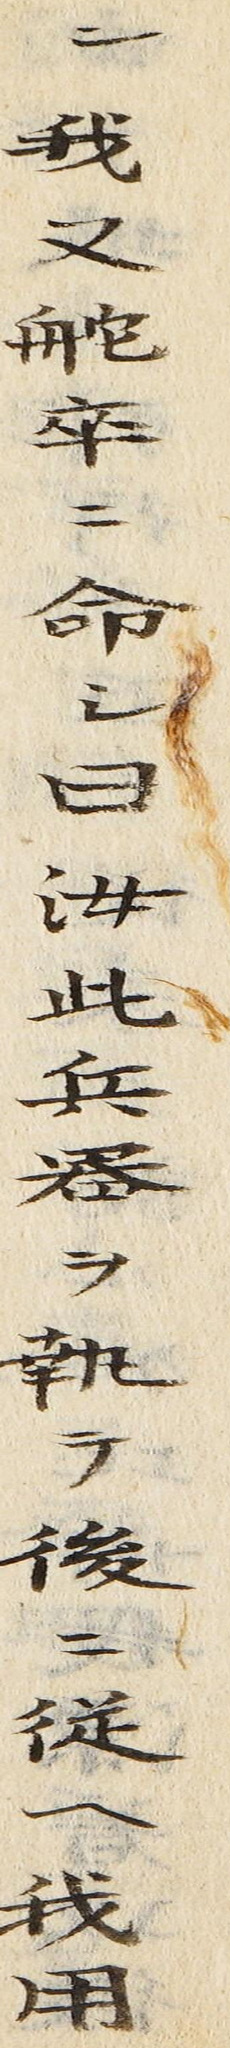ン我又舵卒ニ命シ曰汝此兵器ヲ執テ後ニ従ヘ我用
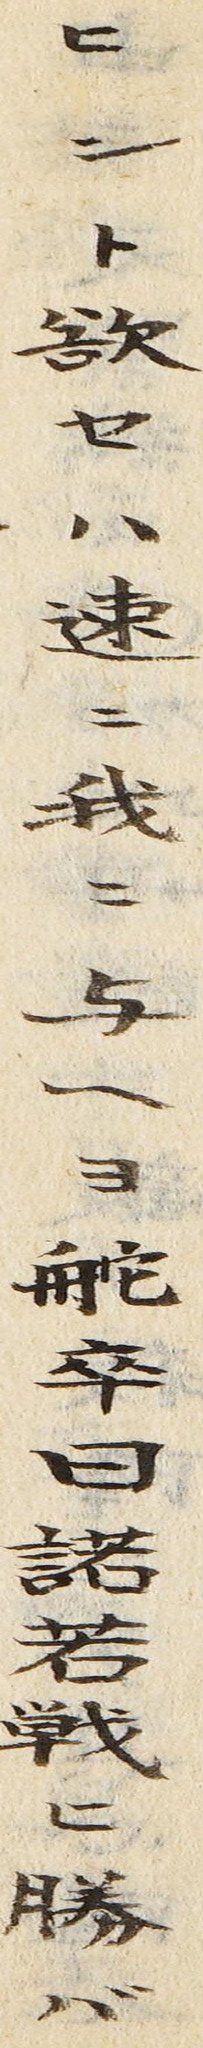ヒント欲セハ速ニ我ニ与ヘヨ舵卒曰諾若戦ヒ勝バ
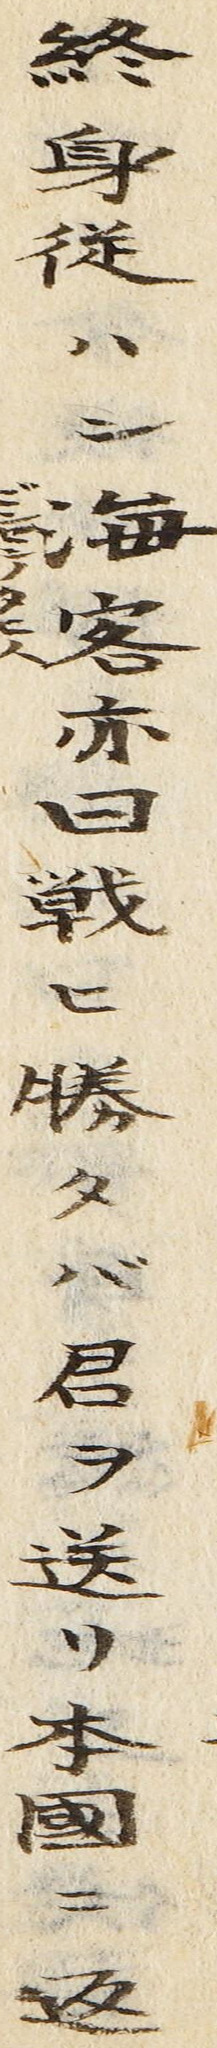終身従ハン海客亦曰戦ヒ勝タバ君ヲ送リ本国ニ返
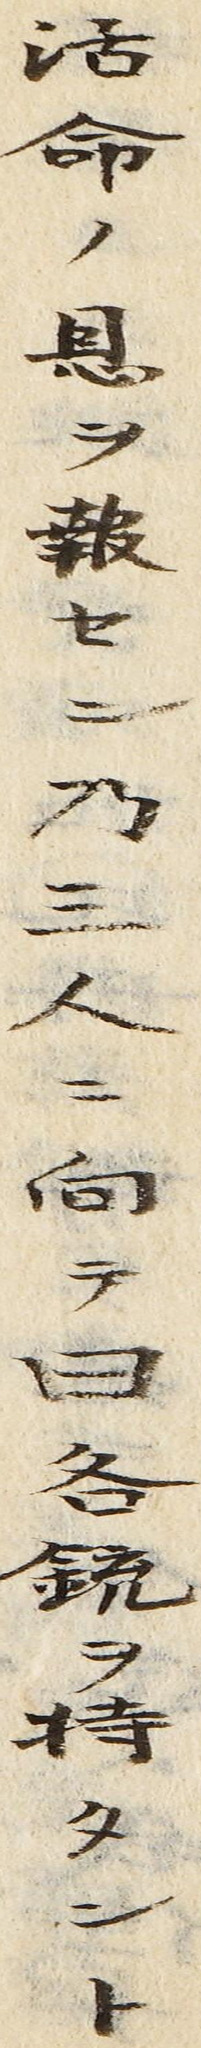活命ノ恩ヲ報セン乃三人ニ向テ曰各銃ヲ持タント
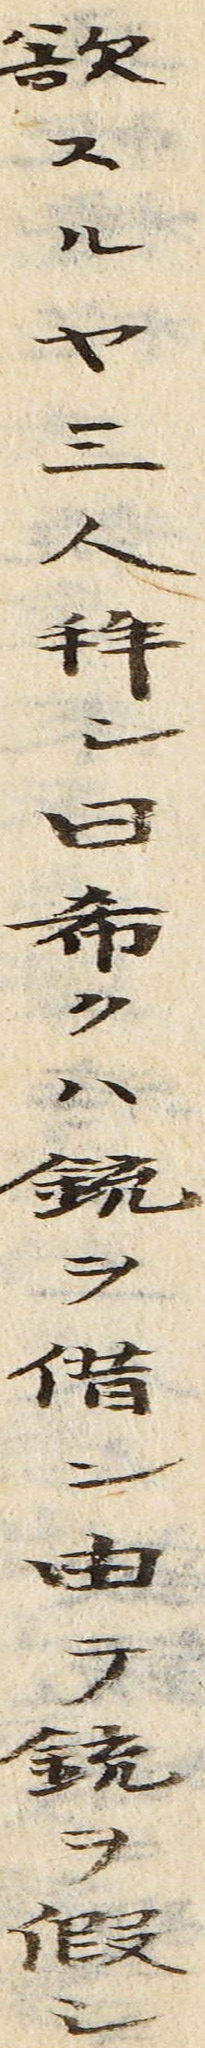欲スルヤ三人拝シ曰希クハ銃ヲ借ン由テ銃ヲ仮シ
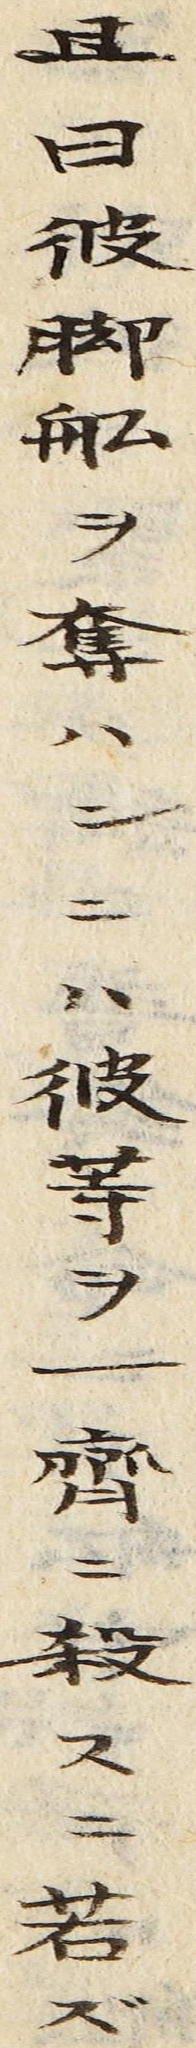且曰彼脚船ヲ奪ハンニハ彼等ヲ一斉ニ殺スニ若ズ
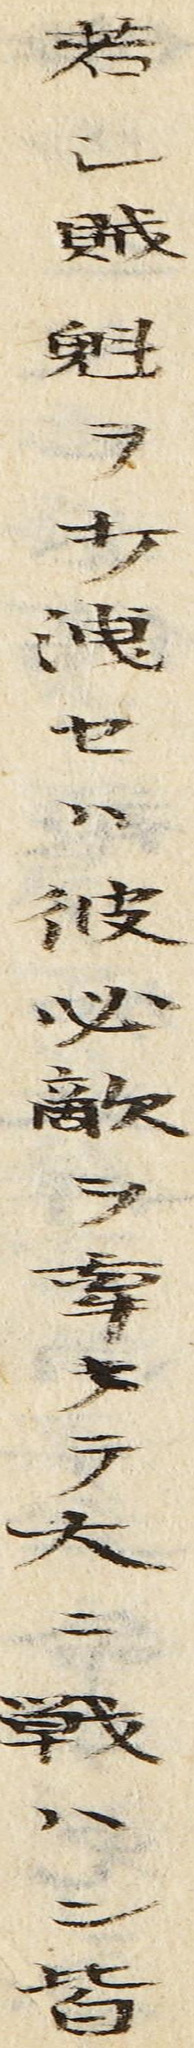若シ賊魁ヲ打洩セハ彼必敵ヲ率ヒテ大ニ戦ハン皆
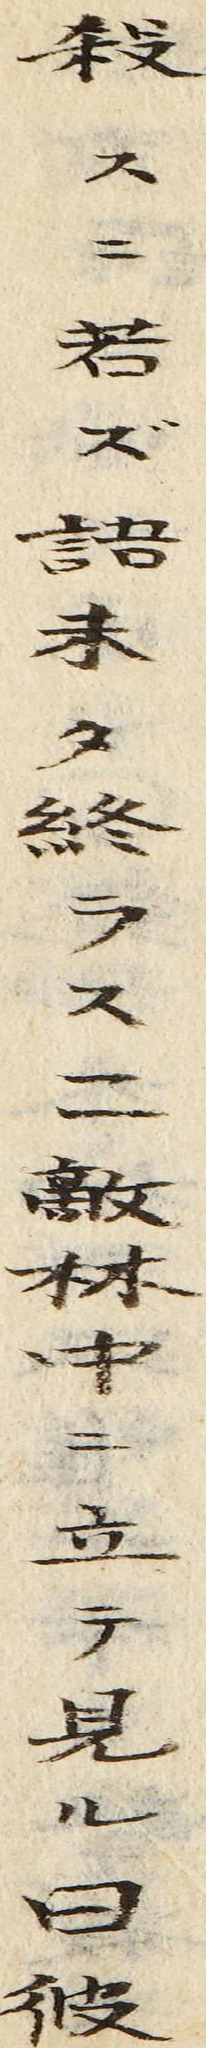殺スニ若ズ語未タ終ラス二敵林中ニ立テ見ル曰彼
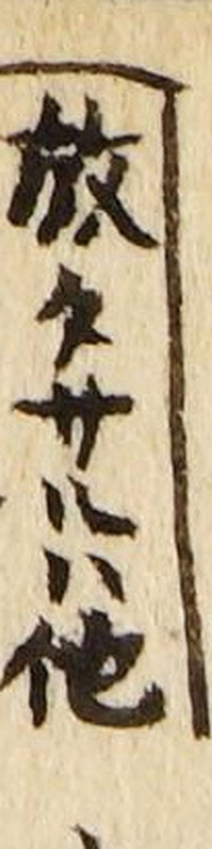放タサルハ他
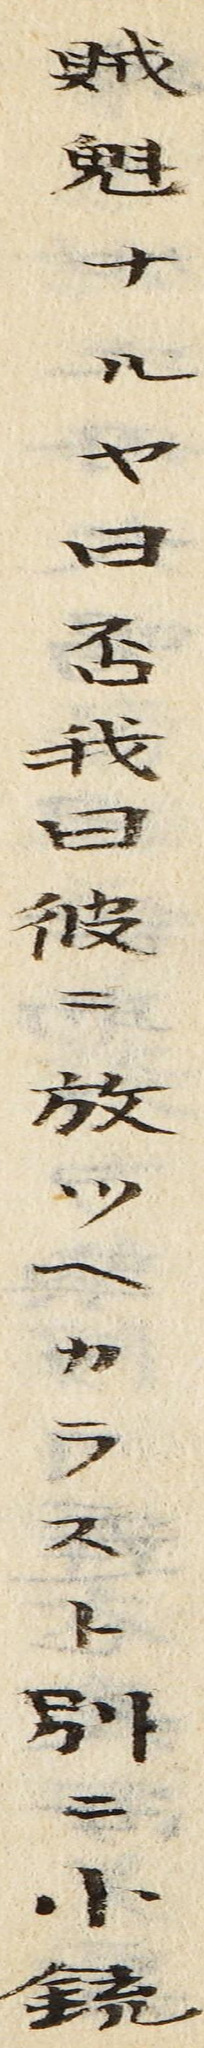賊魁ナルヤ曰否我曰彼ニ放ツヘカラスト別ニ小銃
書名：漂流紀事
